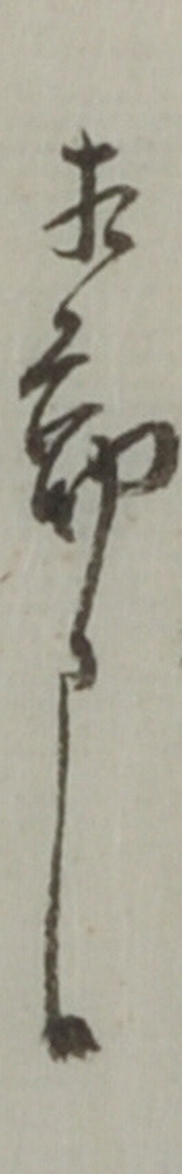相勤申候
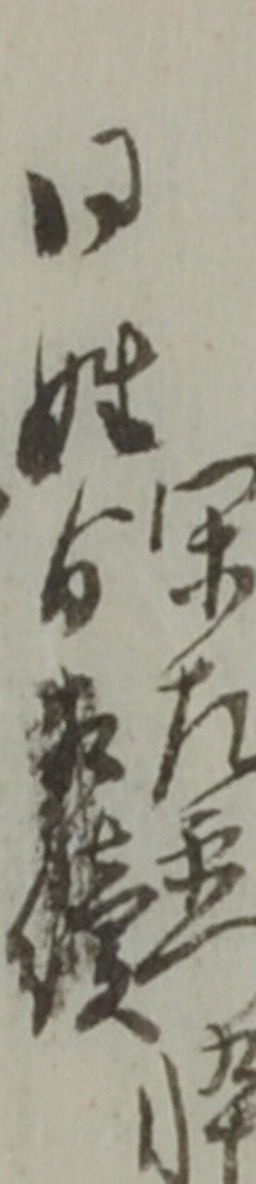同姓ゟ相続
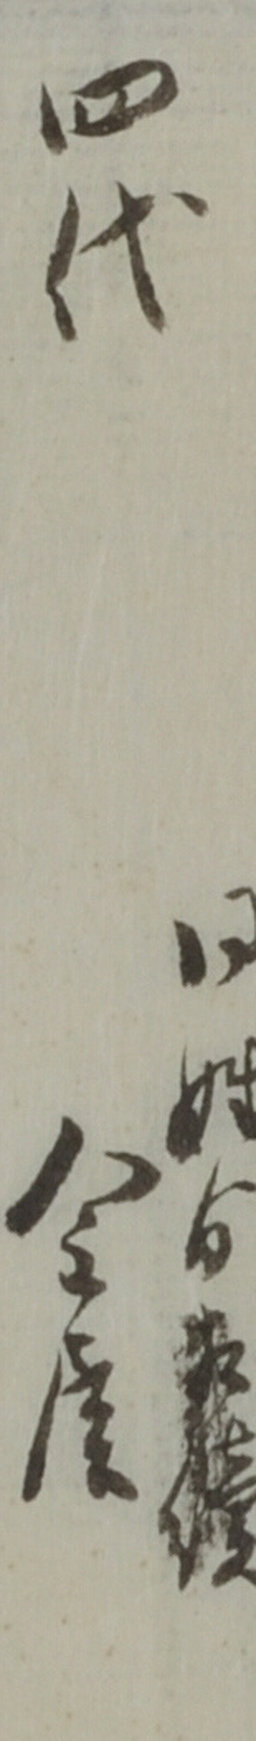四代金屋
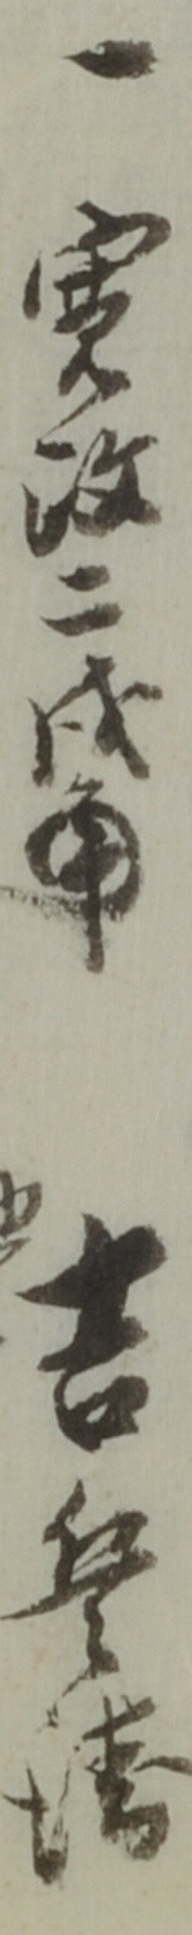一寛政二戌年吉兵衛
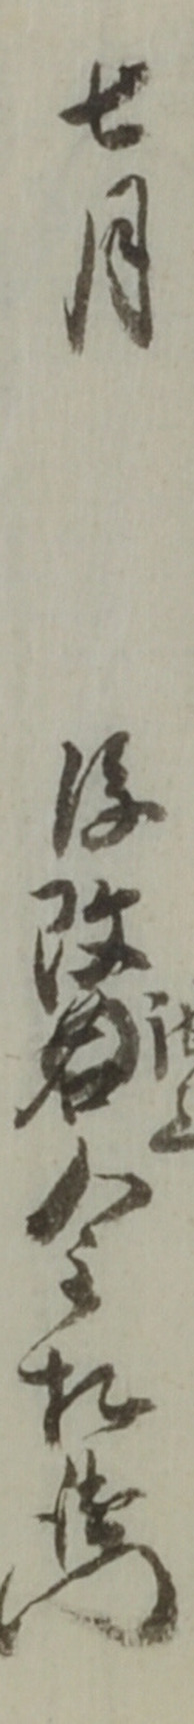七月後改名金左衛門
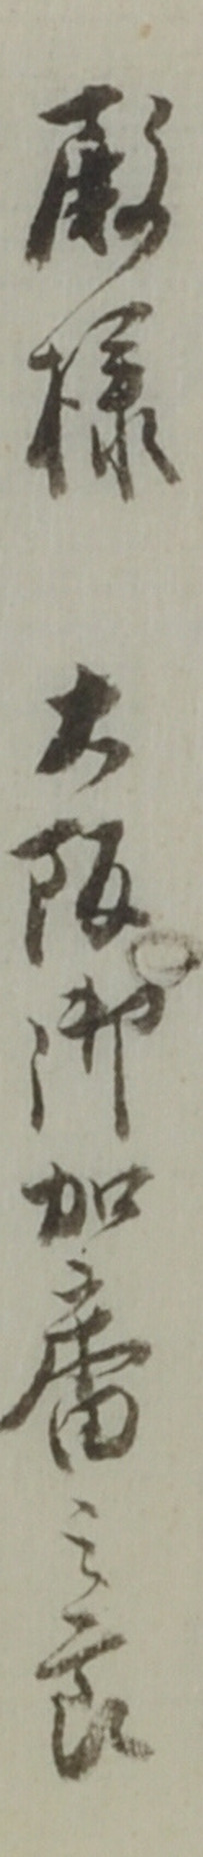殿様大阪御加番之節
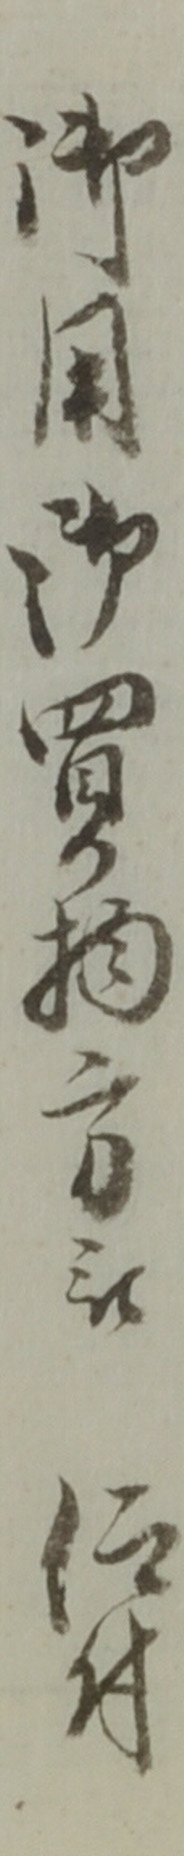御用御買物方被仰付
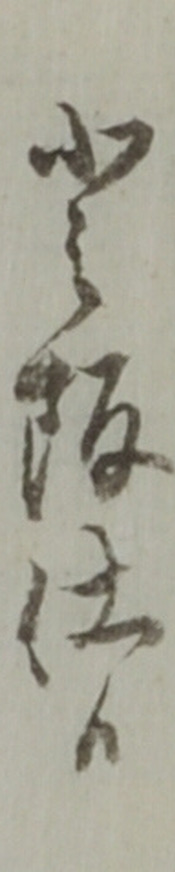登阪仕候
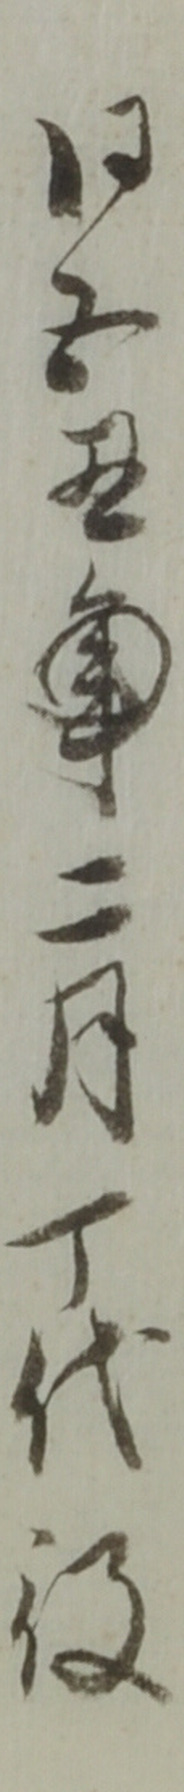同五丑年二月丁代役
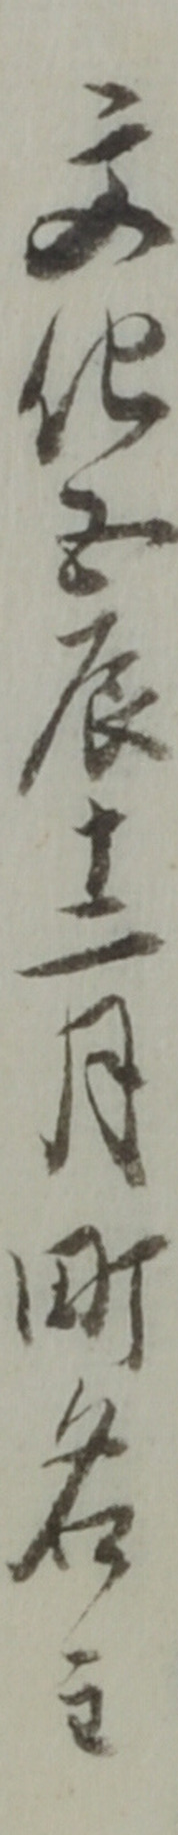文化五辰十二月町名主
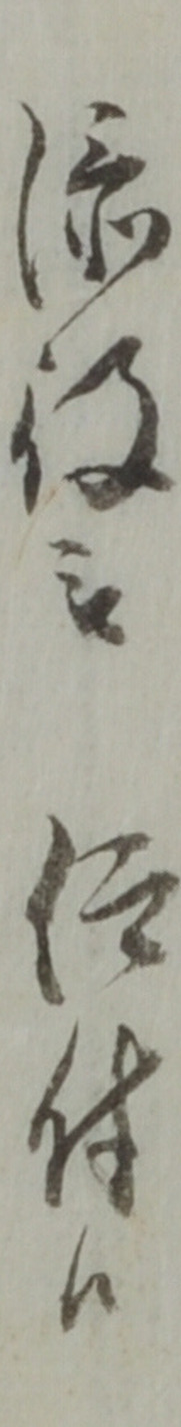添役被仰付候
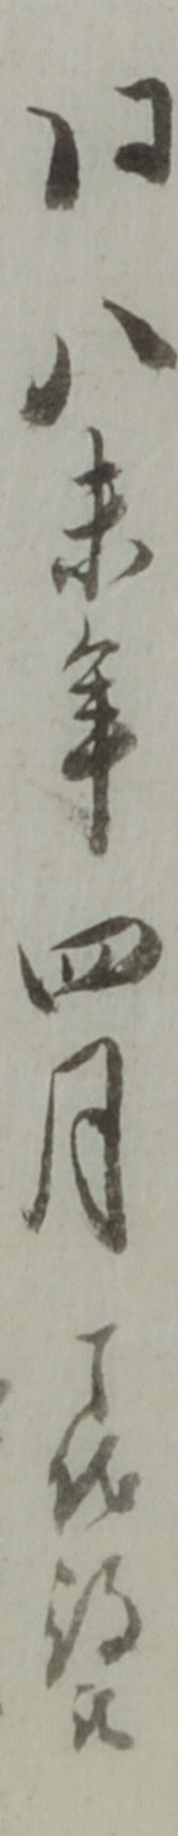同五丑年二月丁代役
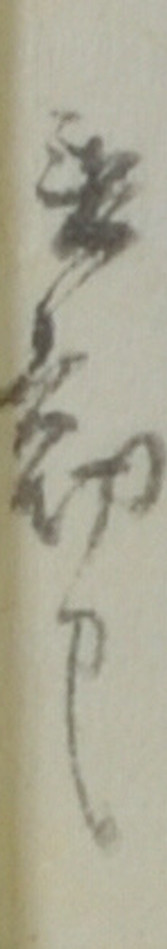相勤申候

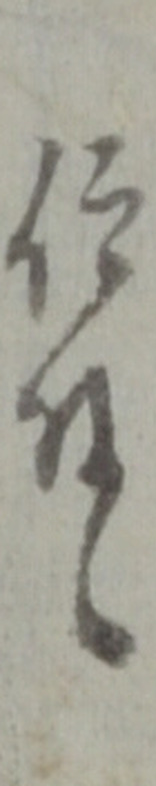仰付候
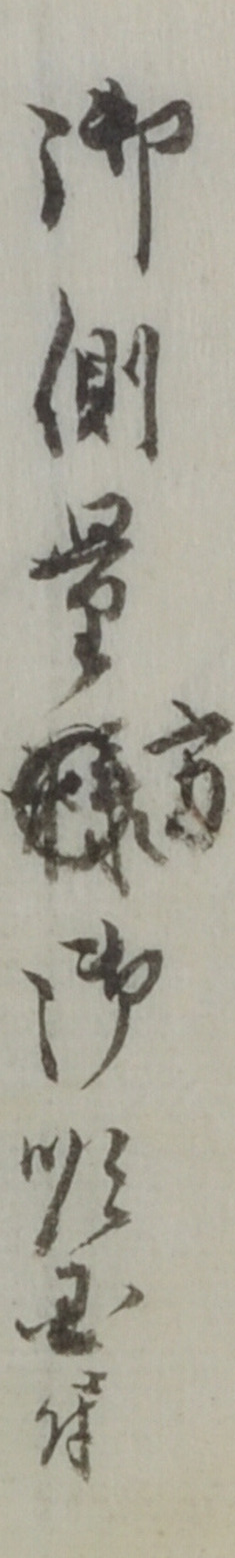御側量様御順刻ニ付
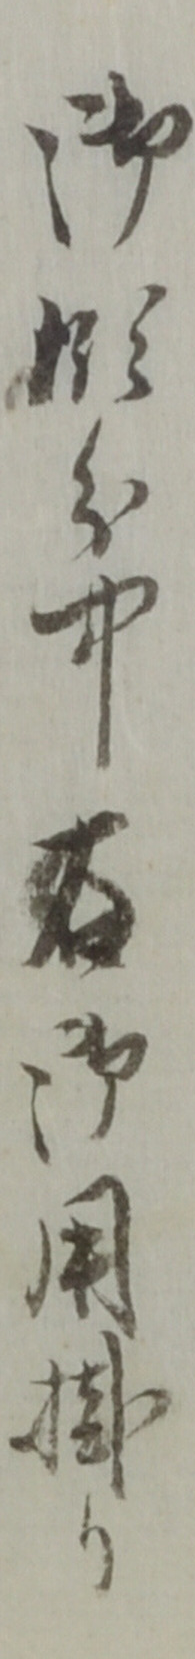御領分中石御用掛リ
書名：（書上）
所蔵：伊那市立高遠町図書館・合同会社AMANE
